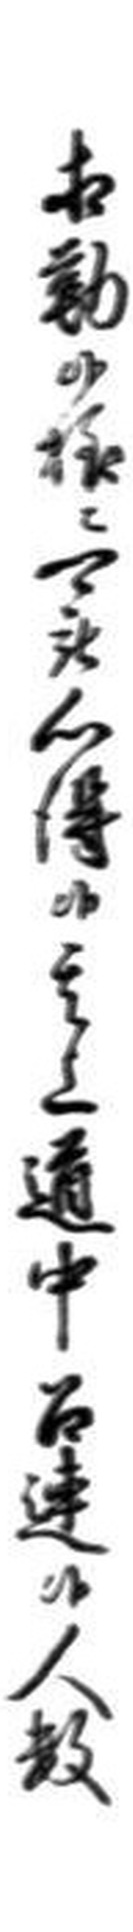相勤候様ニ可被心得候其上道中召連候人数
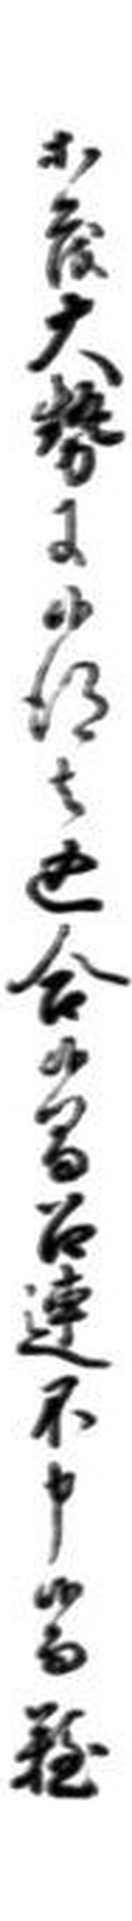等茂大勢に候得者込合候間召連不申候而難
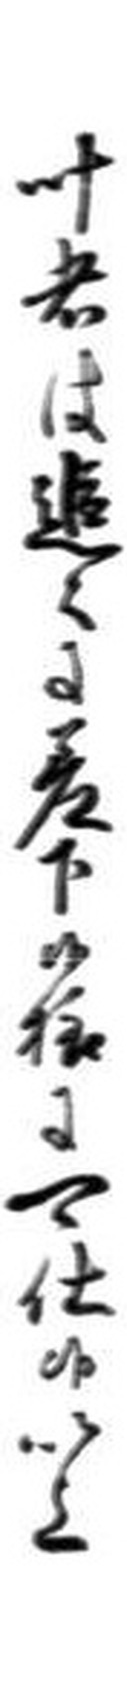叶者は追々に差下候様に可仕候以上

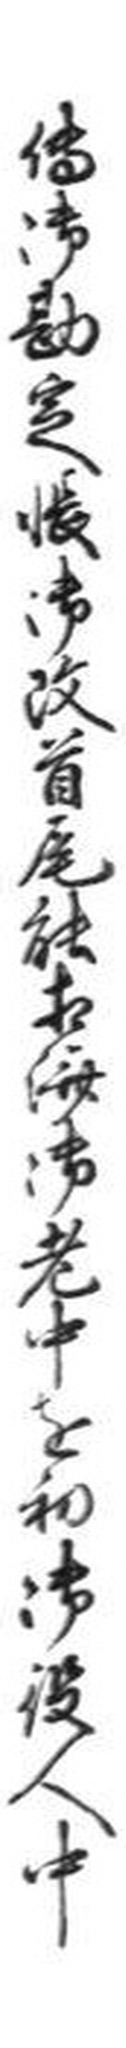伝御勘定帳御改首尾能相済御老中を初御役人中
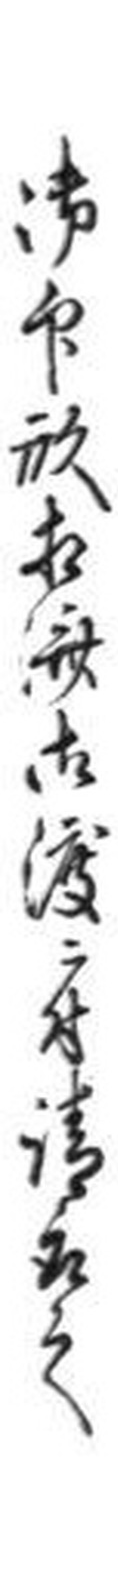御印形相済御渡ニ付請取之
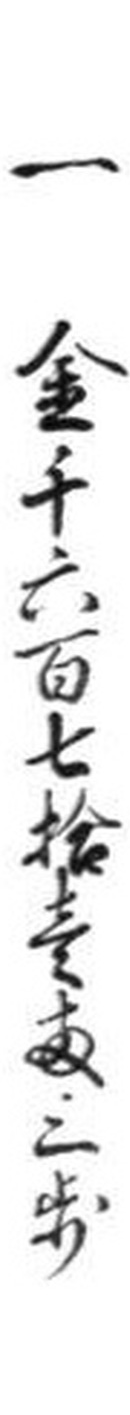一金千六百七拾壱両三歩
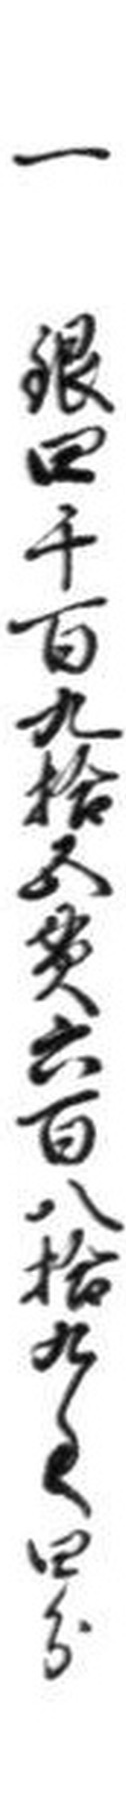一銀四千百九拾五貫六百八拾九匁四分
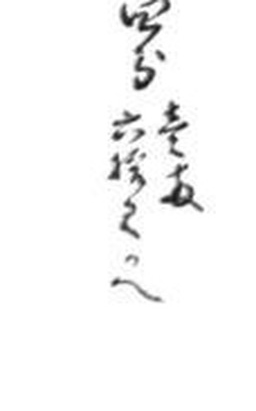六拾匁かへ
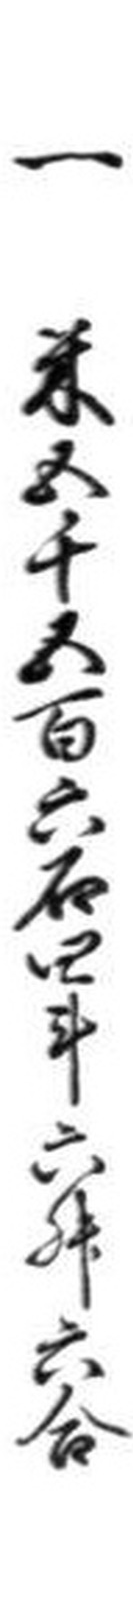一米五千五百六石四斗六升六合
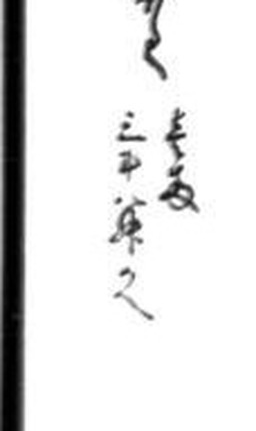三斗八升かへ
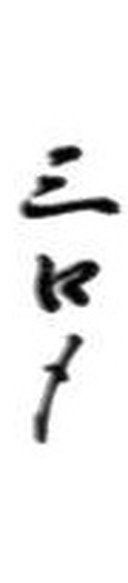三口〆
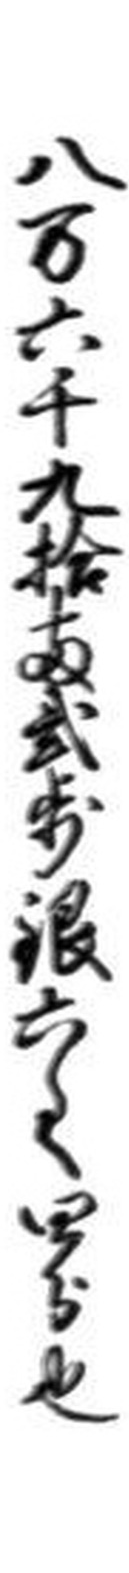八万六千九拾両弐歩銀六匁四分也
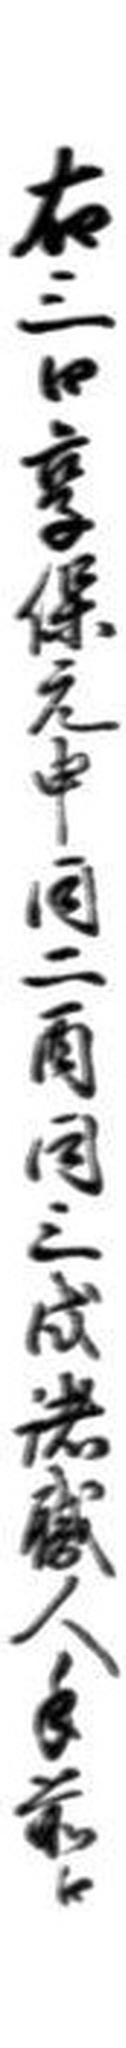右三口享保元申同二酉同三戌諸職人手前江
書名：家譜 三十二 吉邦公 従享保二年到享保三年
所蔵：福井県文書館 Fukui Prefectural Archives
